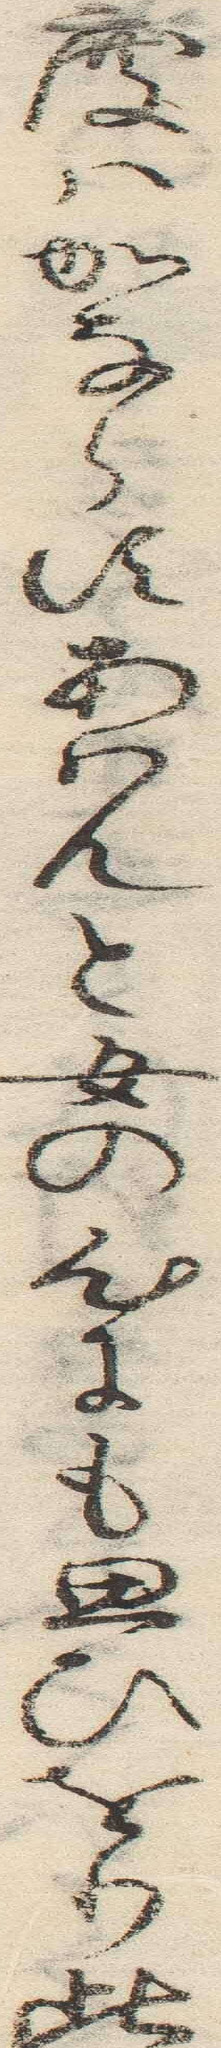度はかならすあはんと女の心にも思ひをり此
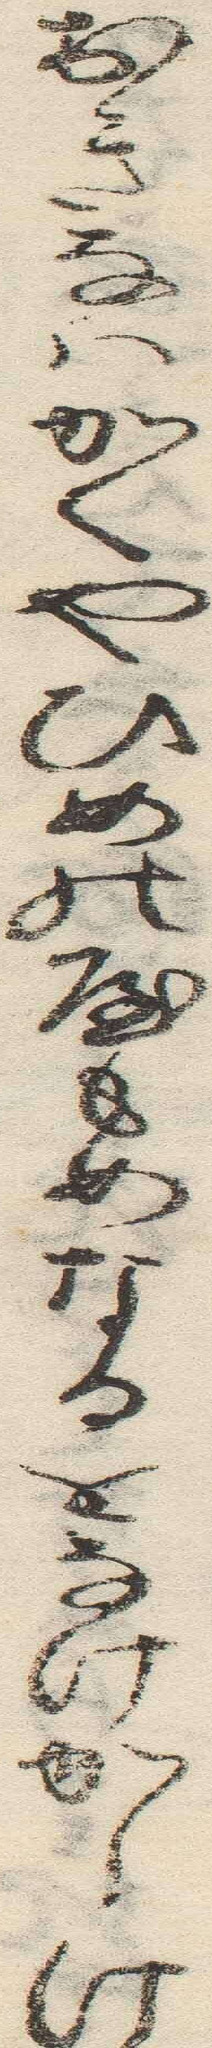おきなはかくやひめのやもめなるをなけかしけ
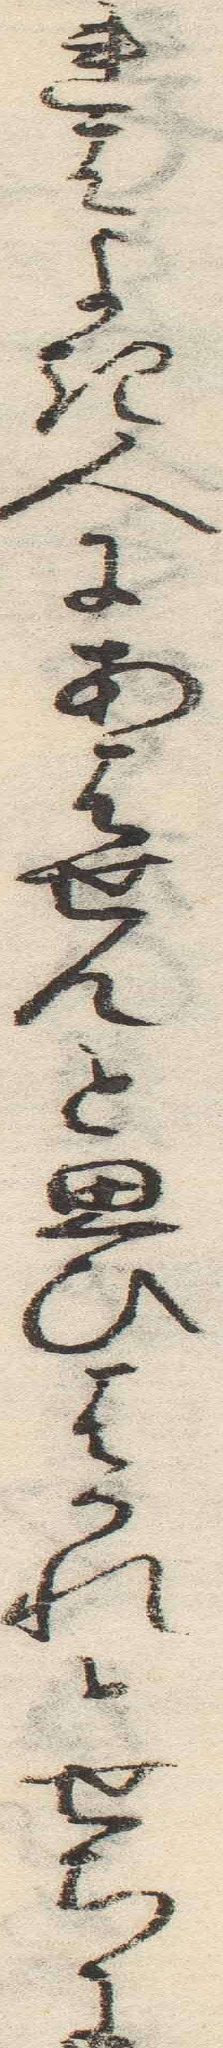れはよき人にあはせんと思ひはかれとせちに
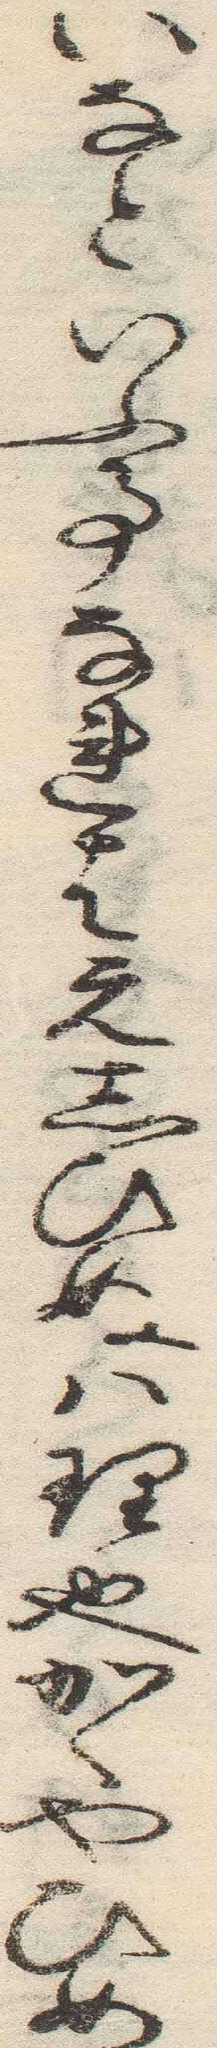いなといふ事なれはえしひぬは理也かくやひめ
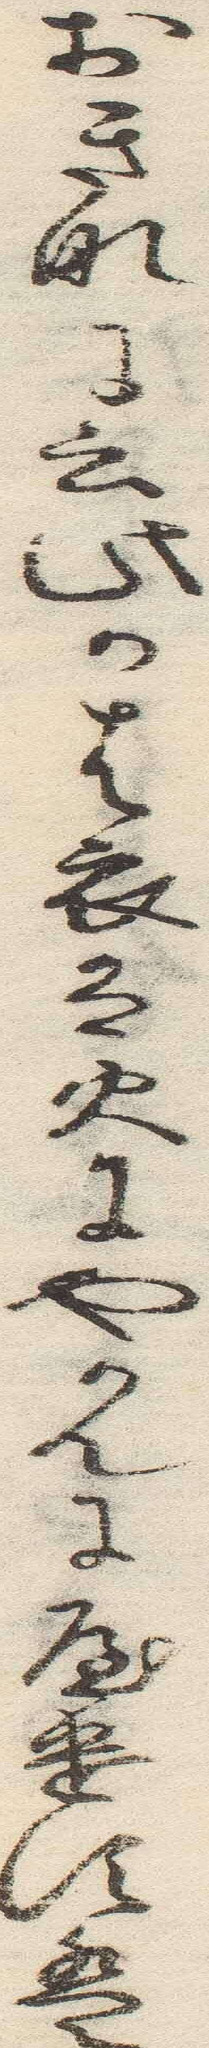おきなに云此かは衣は火にやかんにやけすは
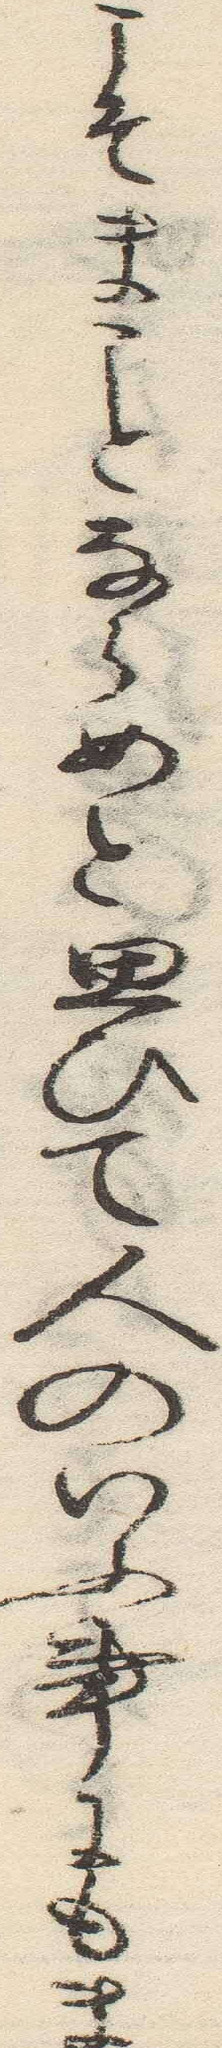こそまことならめと思ひて人のいふ事にもま
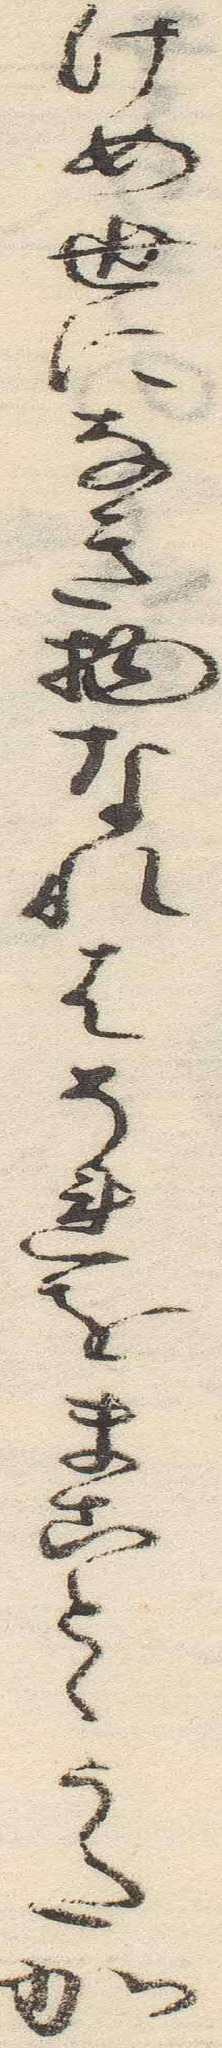けめ世になき物なれはそれをまことゝうたか
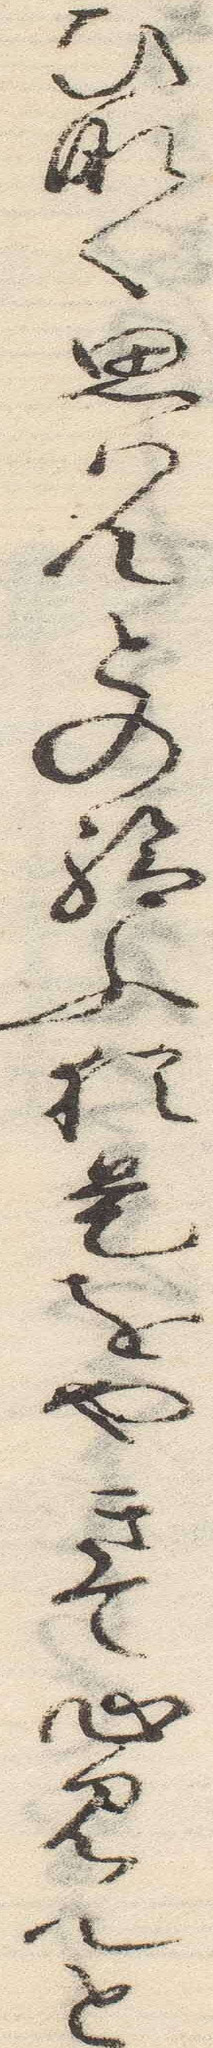ひなく思はんとの給ふ猶是をやきて心みんと
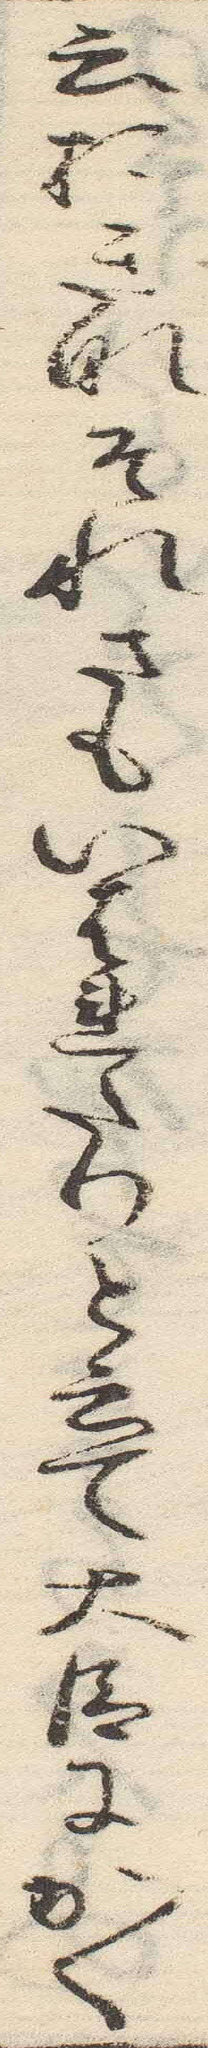云おきなそれさもいはれたりと云て大臣にかく
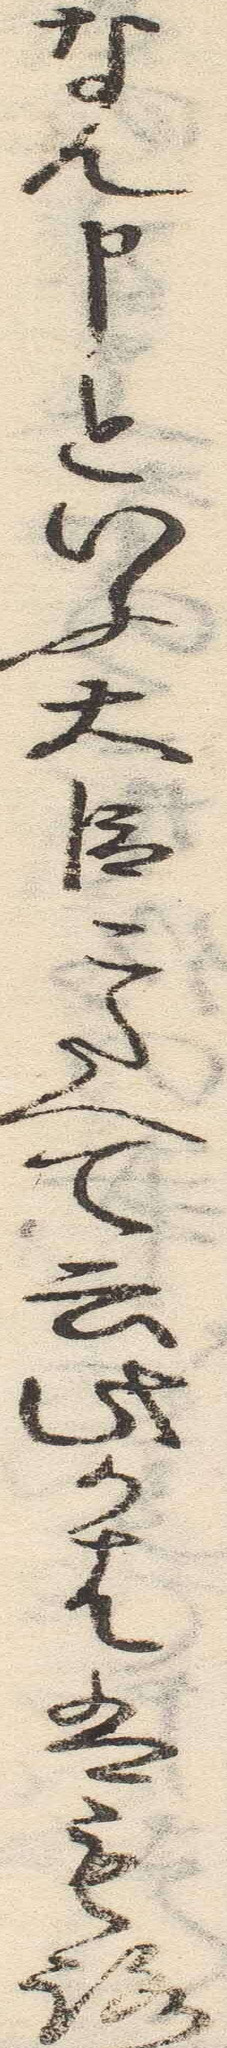なん申といふ大臣こたへて云此かははもろ
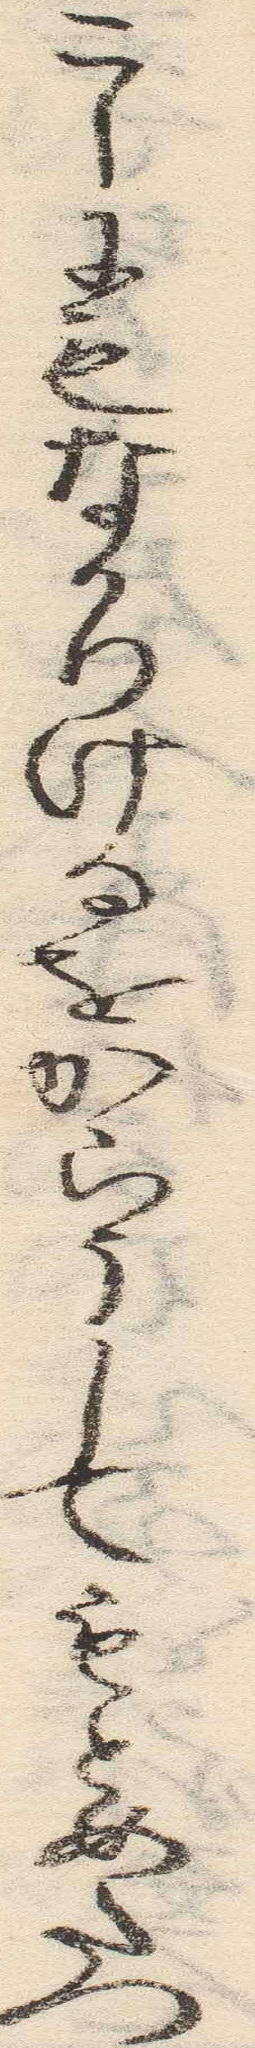こしにもなかりけるをからうしてもとめたつ
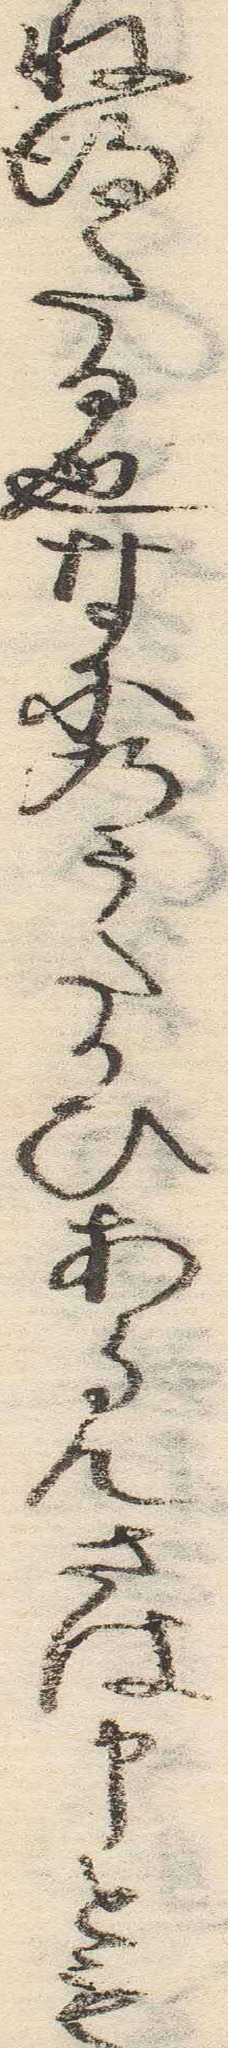ね得たる也なにのうたかひあらんさは申とも
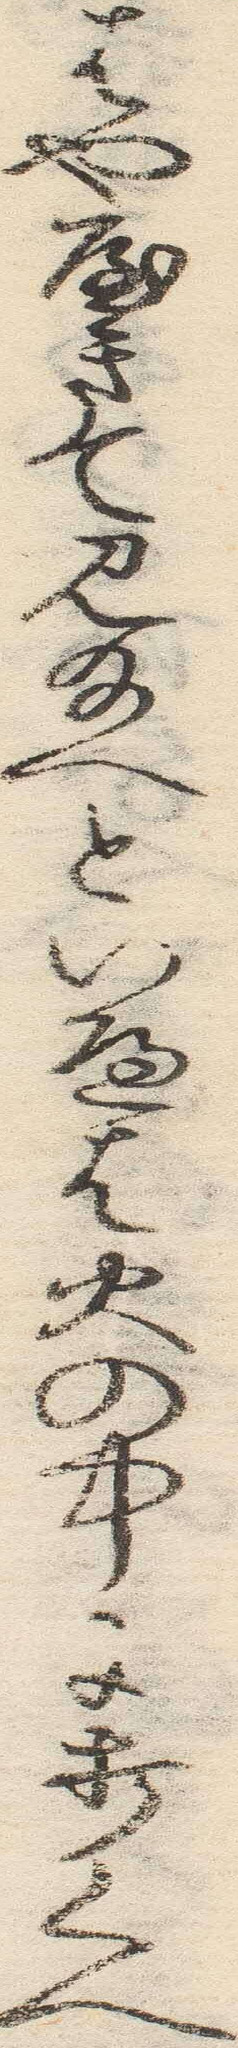はややきてみ給へといへは火の中に打くへ
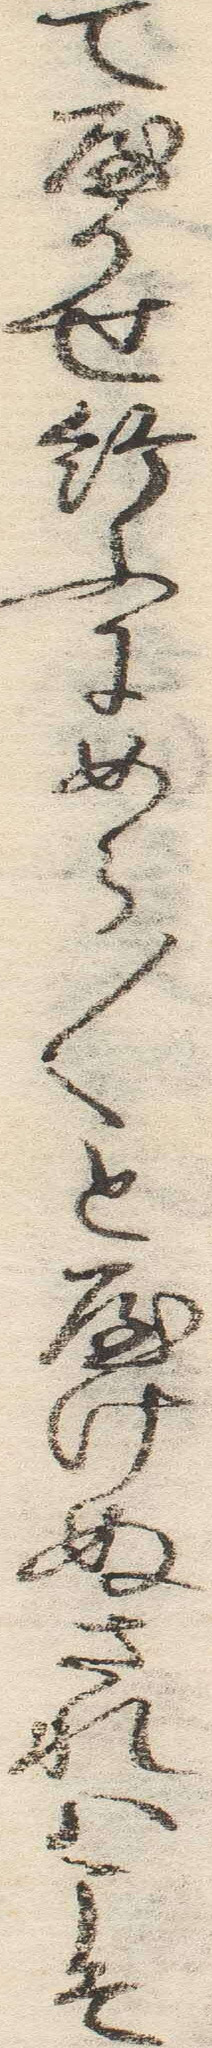てやかせ給ふにめら〳〵とやけぬされはこそ
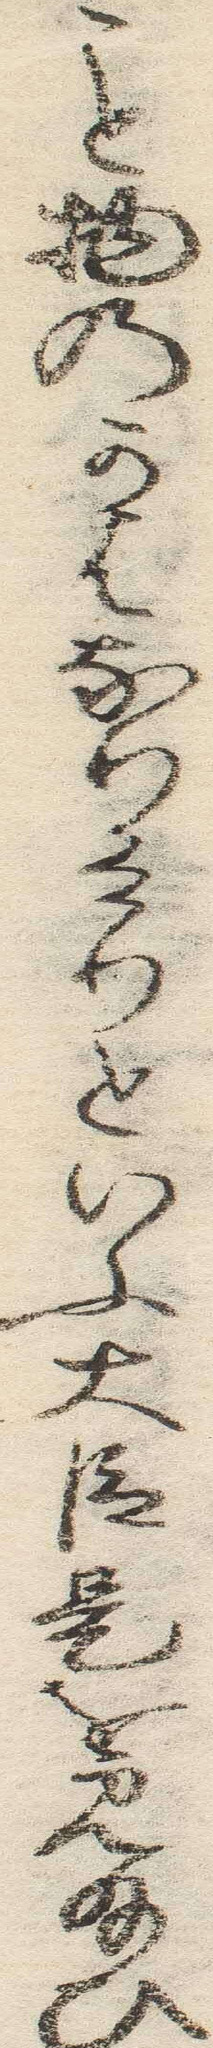こと物のかはなりけりといふ大臣是を見給ひ
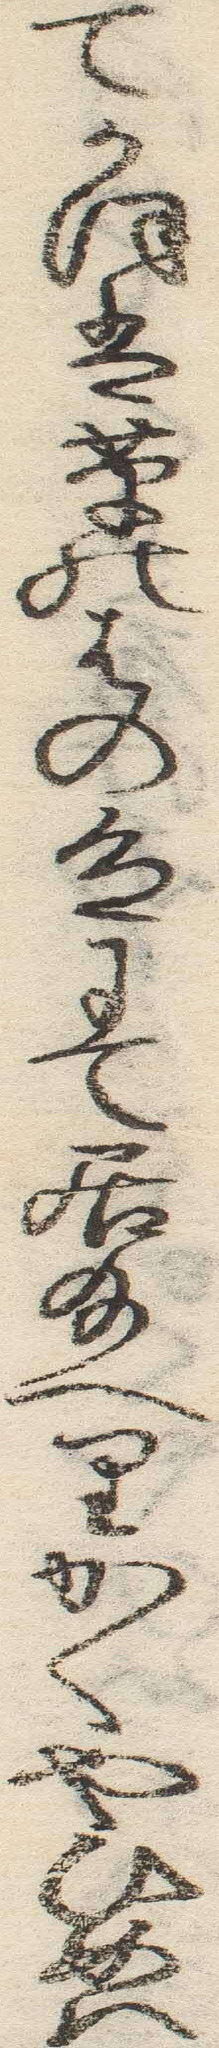てかほは草のはの色にて居給へりかくやひめは
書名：竹取物語
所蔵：東京学芸大学附属図書館 国文学研究資料館
